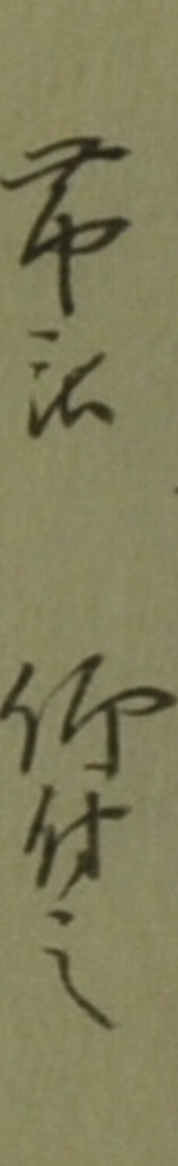帯被仰付之
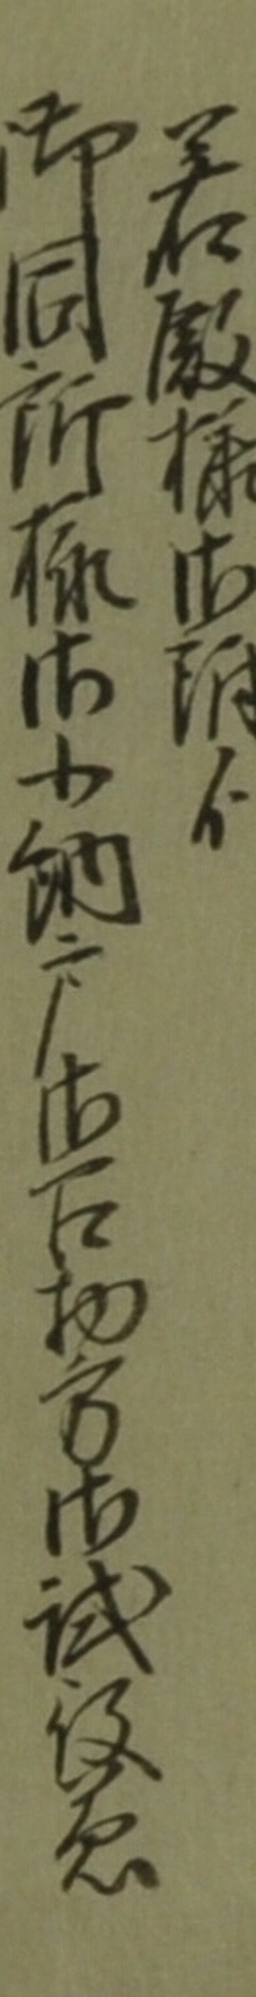一御同所様御小納戸御召物御試役兼

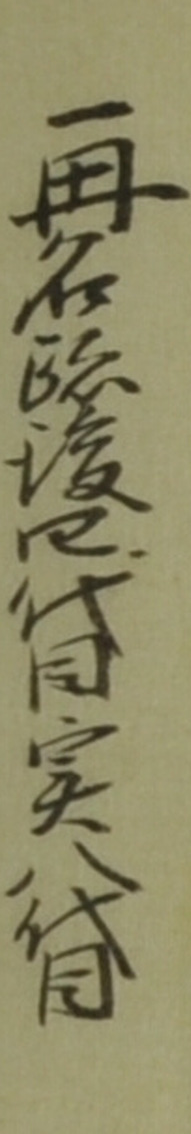再名跡後四代目実八代目
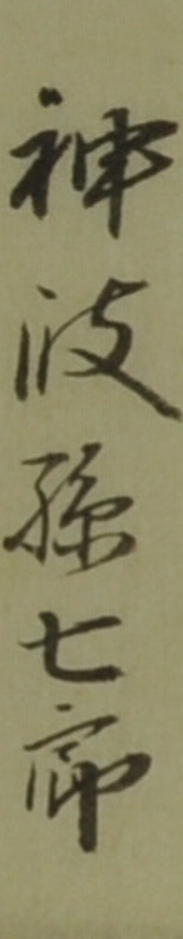神波孫七郎
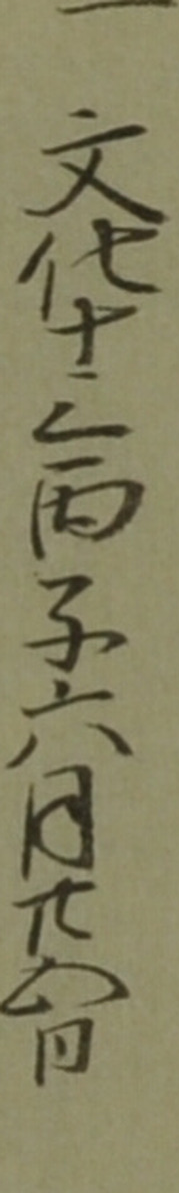一文化十三丙子六月廿五日
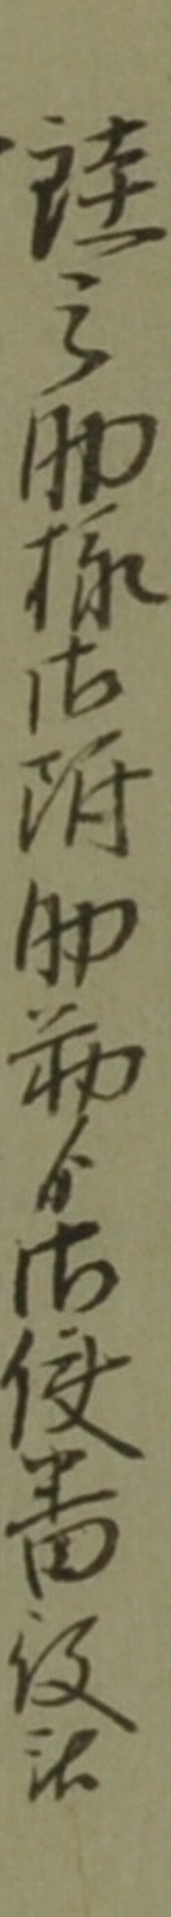銈之助様御附助勤ゟ御使番役被
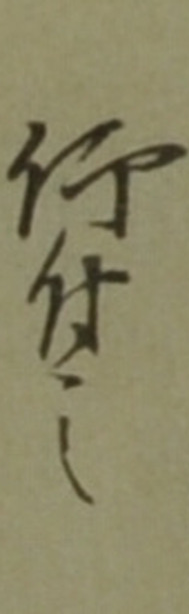仰付之
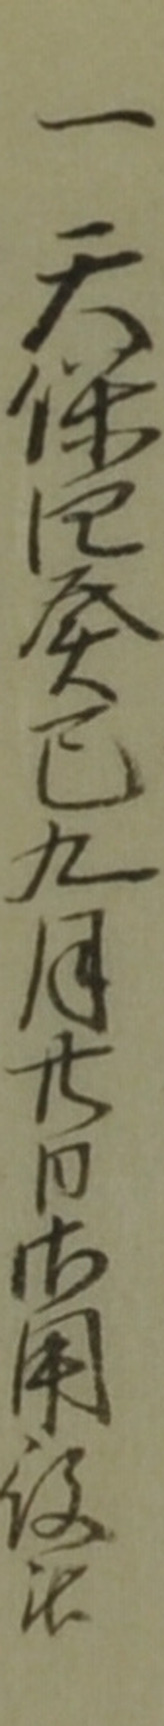一天保四癸巳九月廿日御用役被
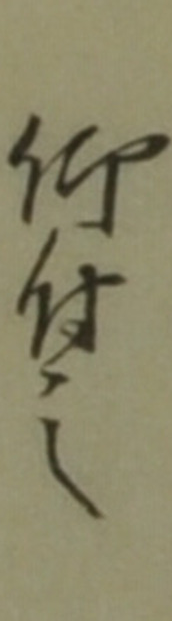仰付之
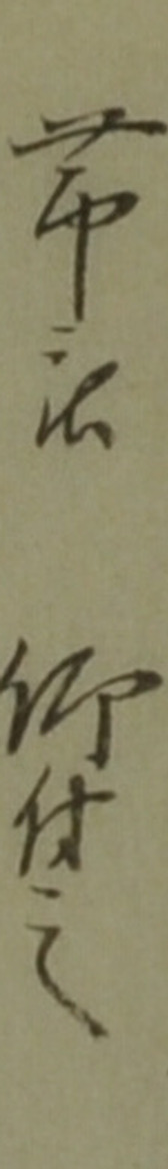帯被仰付之
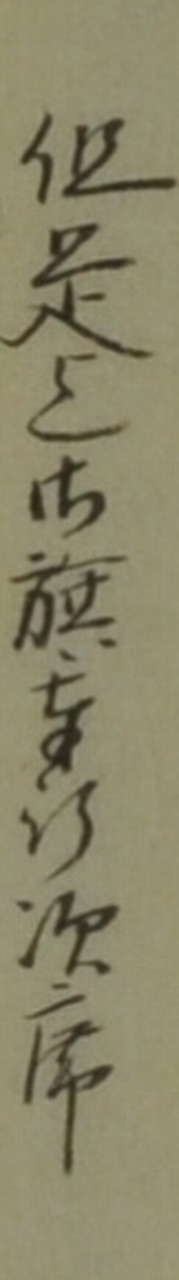但是迄御籏奉行次席
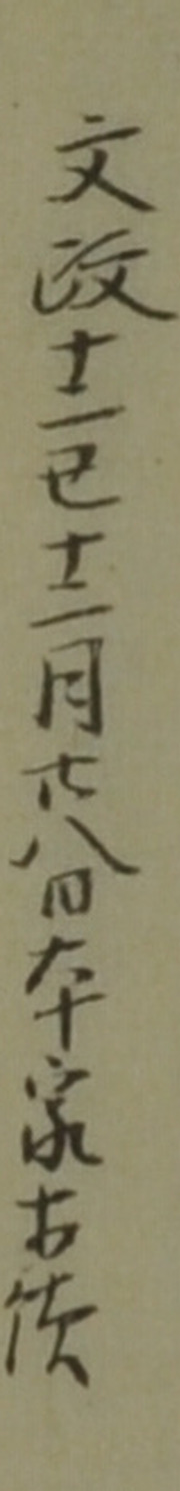文政十二巳十二月廿八日本家相慎
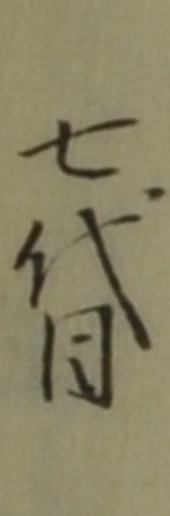七代目
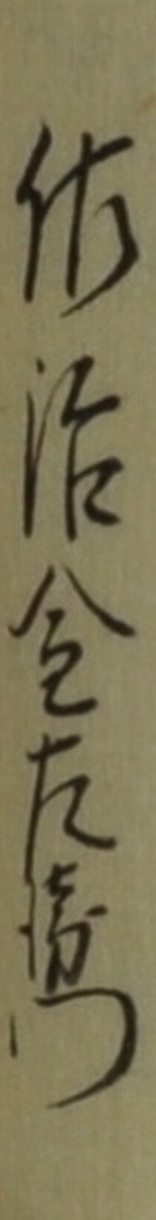佐治金左衛門
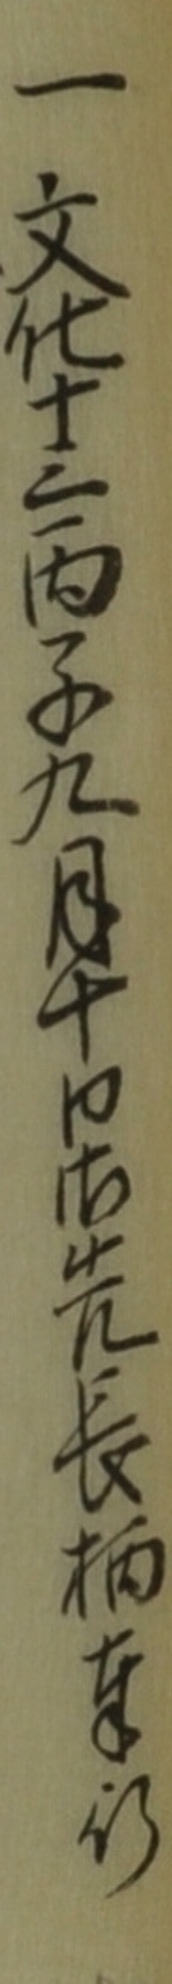一文化十三丙子九月十日御先長柄奉行
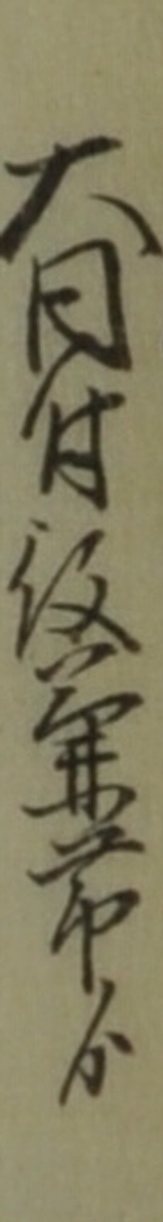大目付仮兼帯ゟ
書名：諸御役代々録（四）
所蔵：伊那市立高遠町図書館・合同会社AMANE
